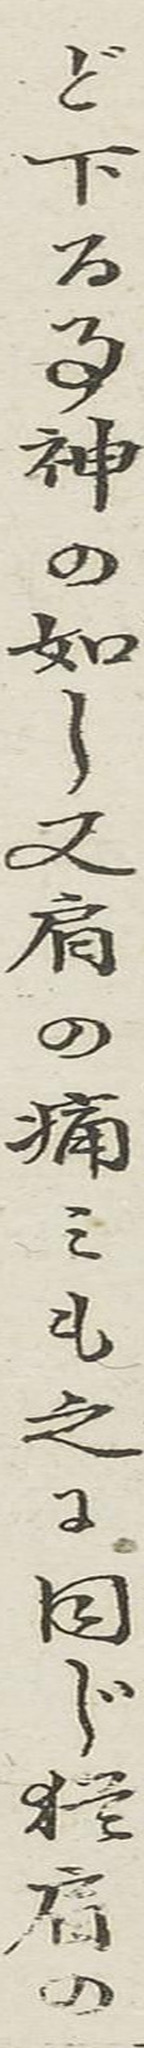ど下る事神の如し又肩の痛みも之に同じ猶肩の
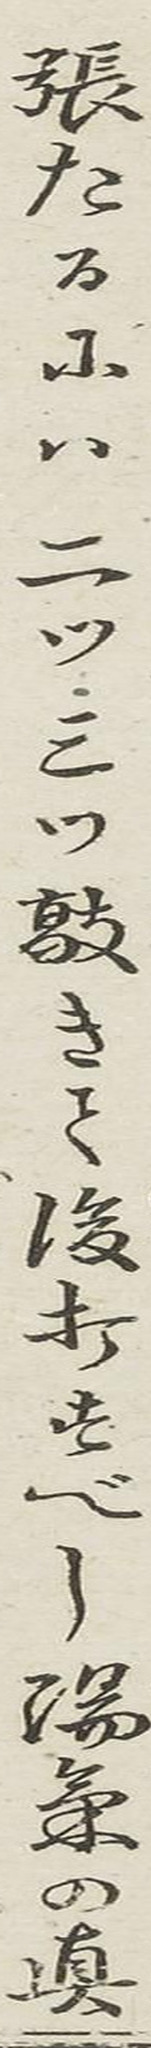帳たるには二ッ三ッ敲きて後打すべし湯氣の眞
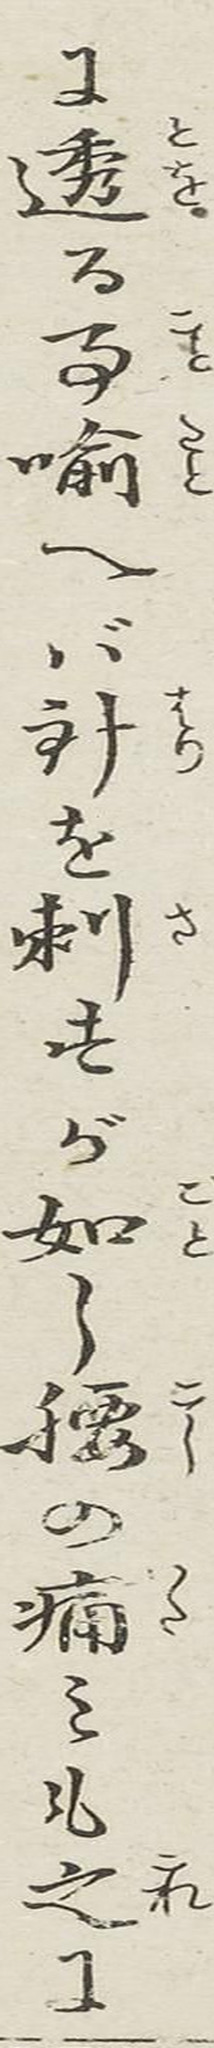に透る事喩へば針を刺すが如し腰の痛みも之に
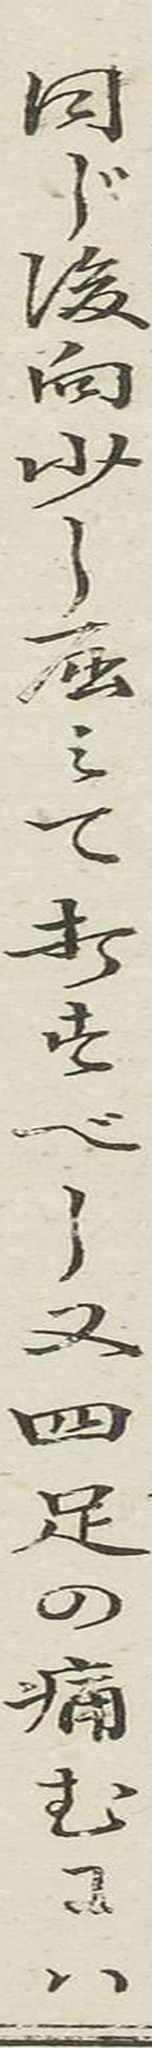同じ後向少し屈みて打すべし又四足の痛むには
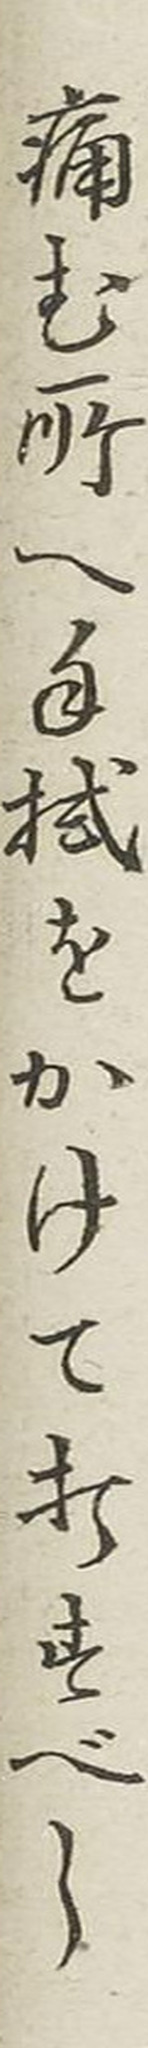痛む所へ手拭をかけて打すべし
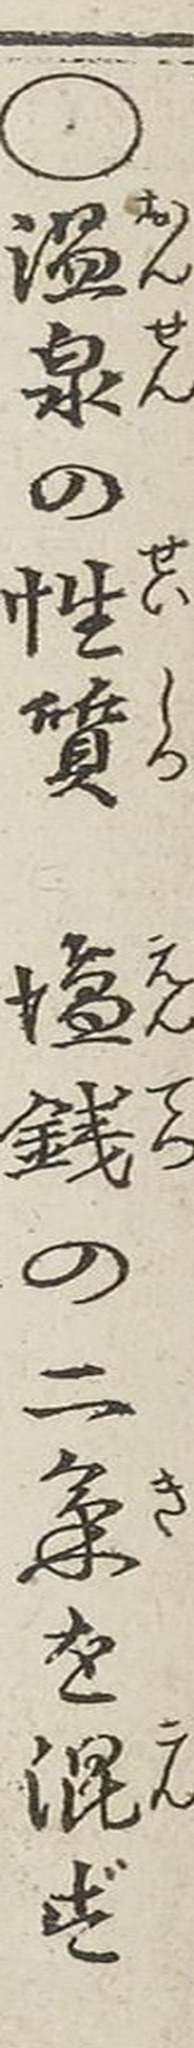○温泉の性質塩銭の二氣を混ず
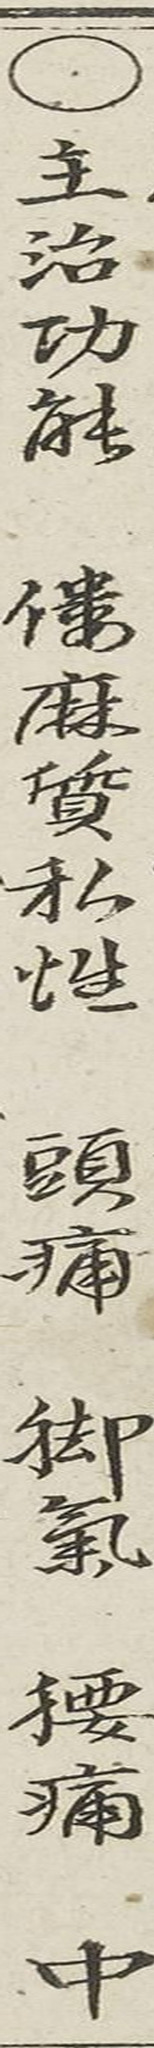○主治功能僂麻質斯性頭痛脚気腰痛中
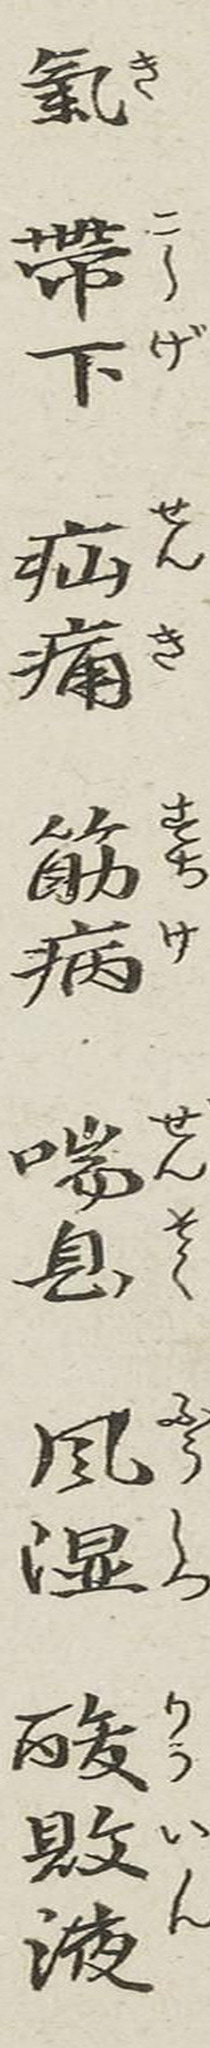氣帯下疝痛筋病喘息風湿酸敗液
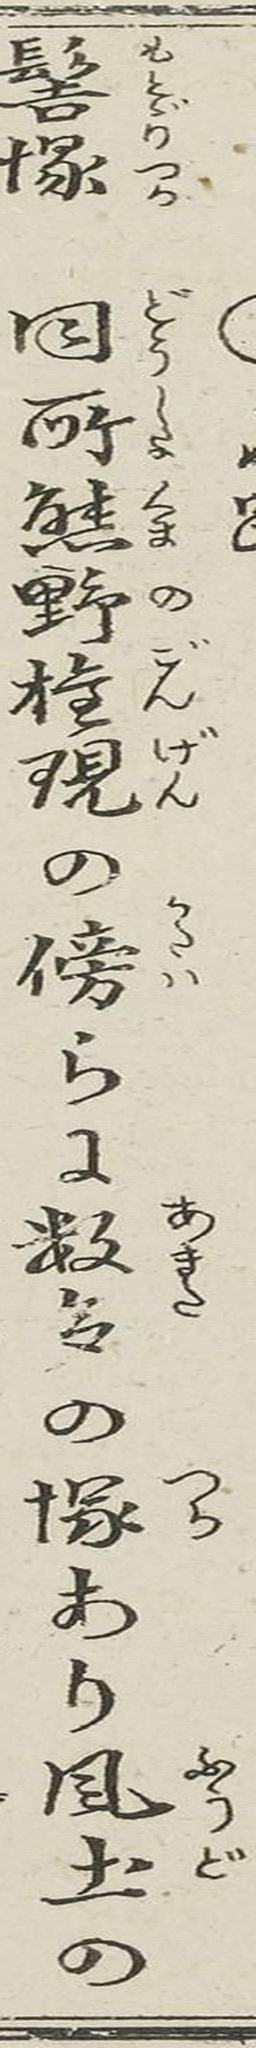髻塚同所熊野権現の傍らに数多の塚あり風土の
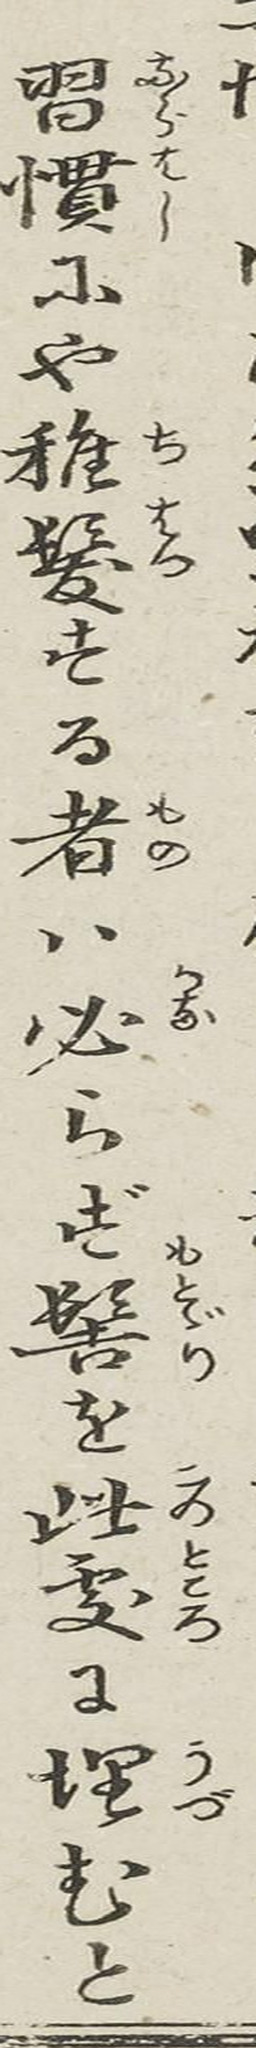習慣にや稚髪する者は必らず髻を此處に埋むと
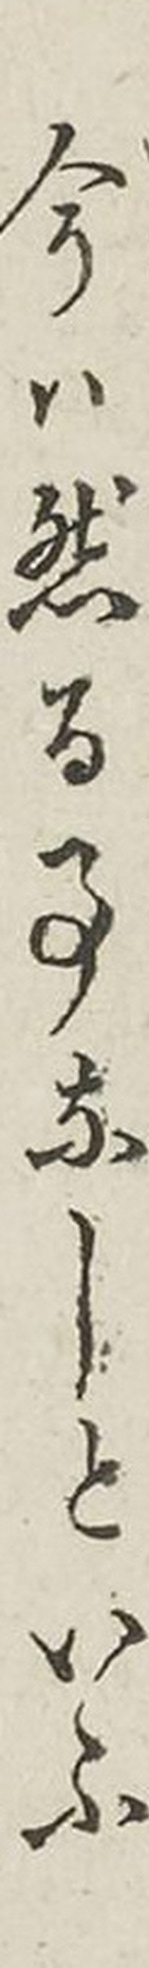今は然る事なしといふ
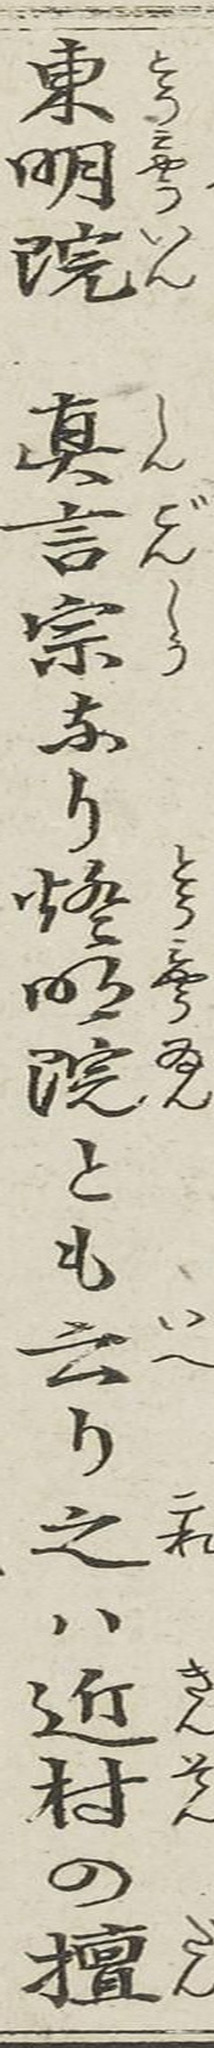東明院真言宗なり燈明院とも云り之は近村の檀
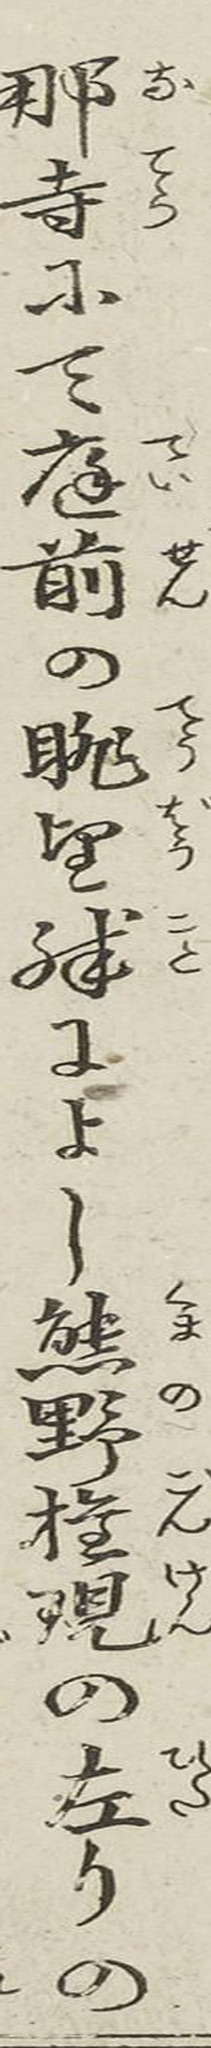那寺にて庭前の眺望殊によし熊野権現の左りの
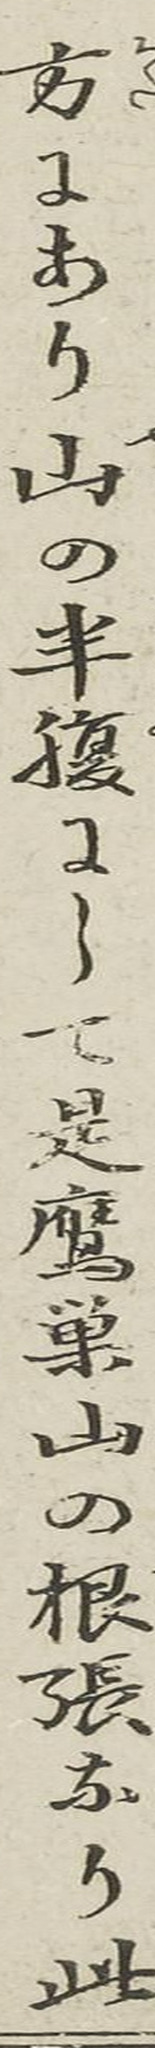方にあり山の半腹にして是鷹巣山の根張なり此

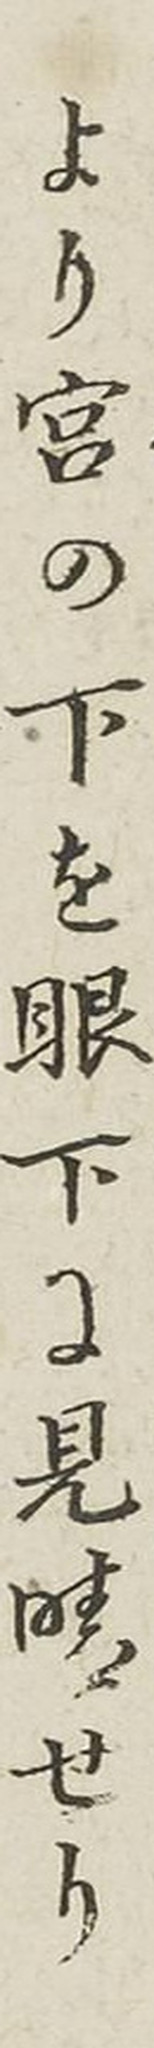より宮の下を眼下に見晴せり
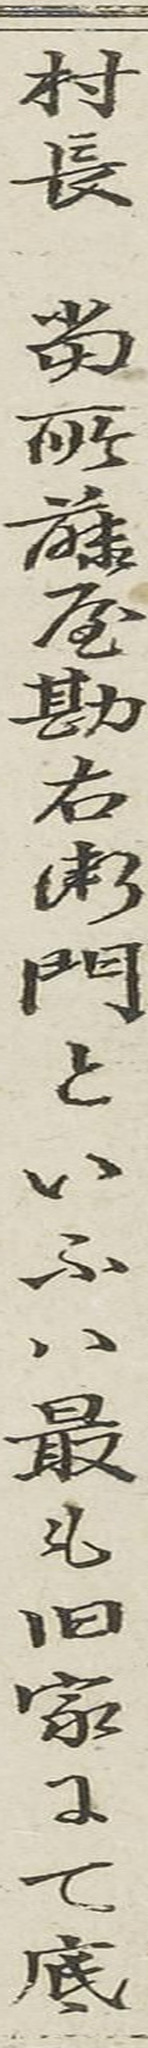村長当所藤屋勘右衛門といふは最も旧家にて底
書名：箱根温泉誌　全
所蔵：東京大学地震研究所図書室 Earthquake Research Institute Library, The University of Tokyo, JAPAN
